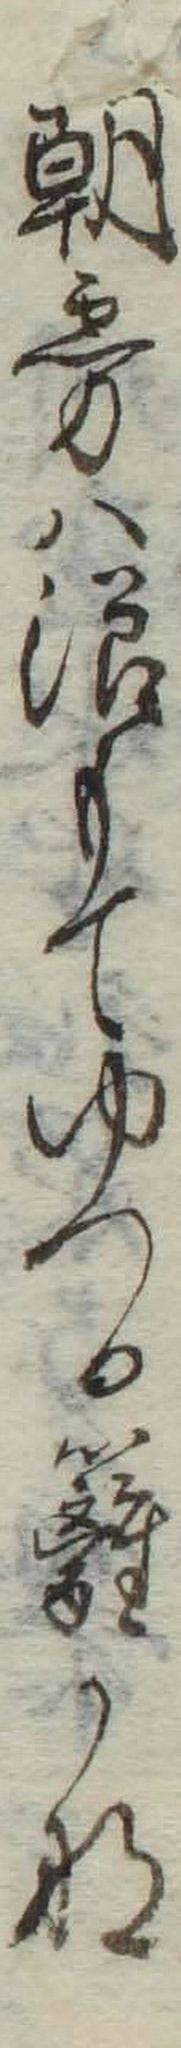朝霧は浪もてゆつる籬かな宗長
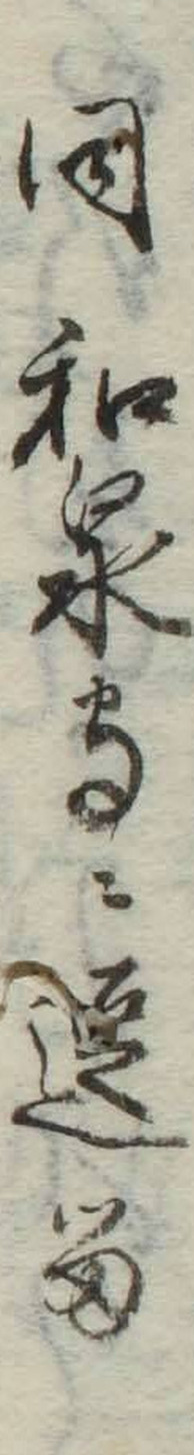同和泉守に逗留
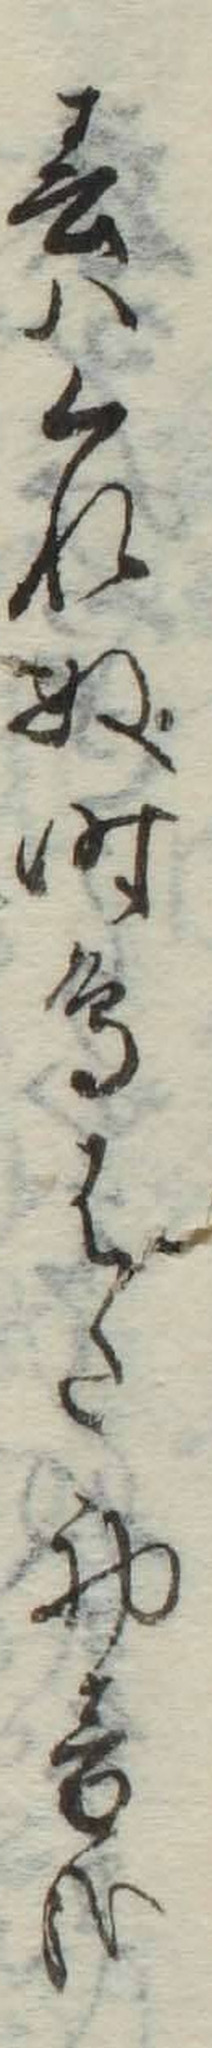春はくれぬ時鳥はた初音哉同
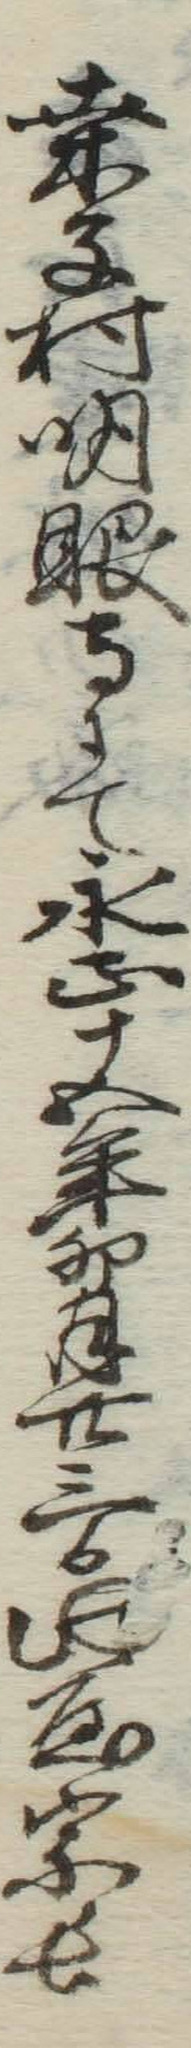桑子村明眼寺にて永正十五年卯月廿三日此柴屋宗長
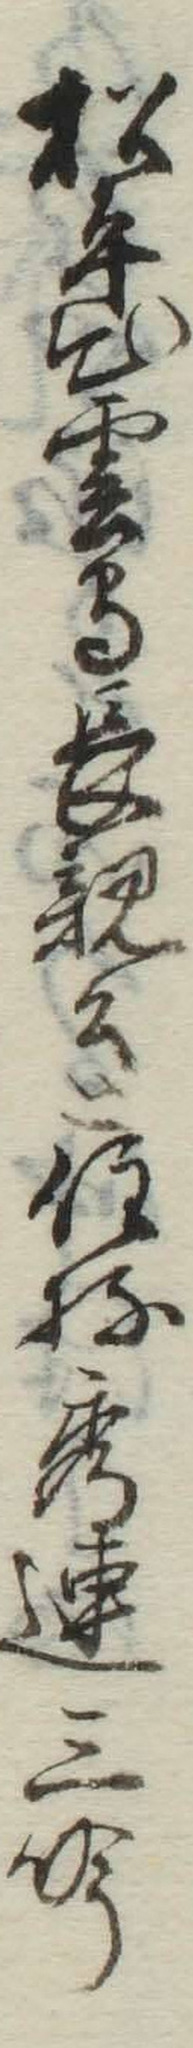松平出雲寺長親公と住持秀連三吟
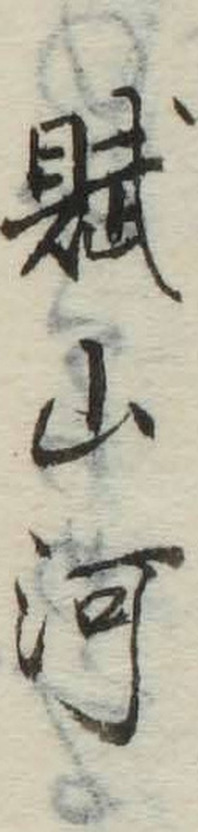賦山河
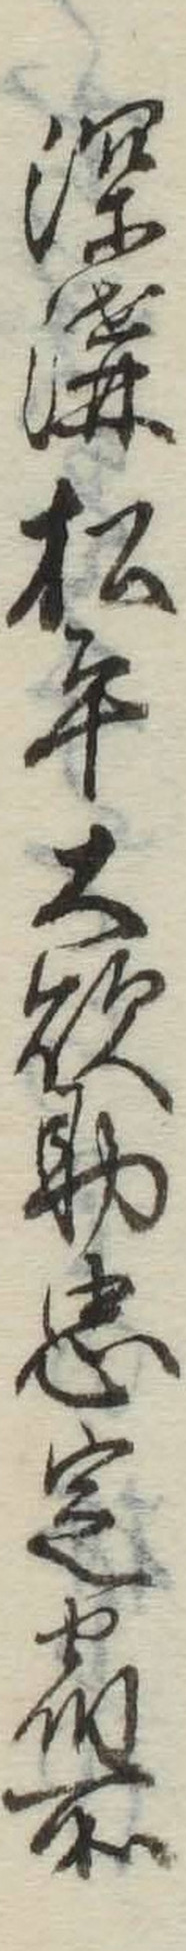深溝松平大炊助忠定宿所
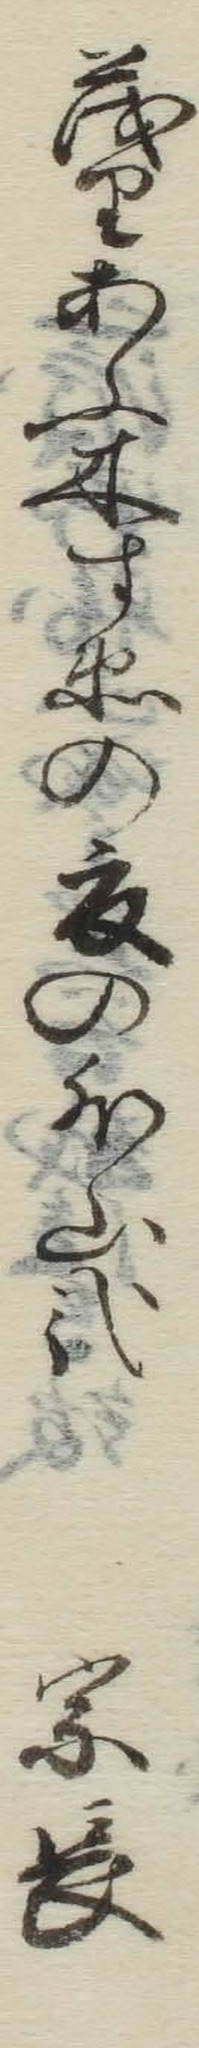茂りあふ木すゑの夏の外山哉宗長
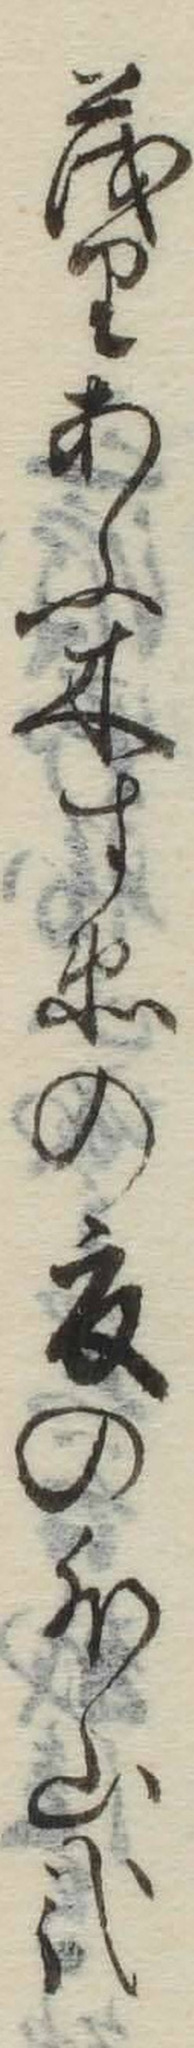茂りあふ木すゑの夏の外山哉宗長
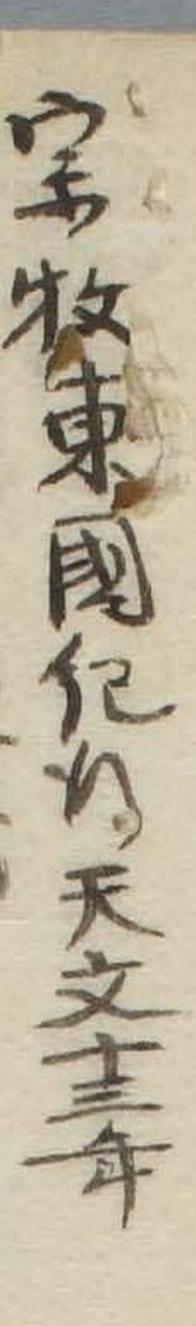宗牧東国紀行天文十三年
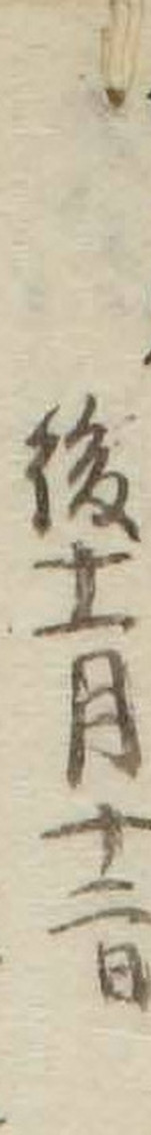後十一月十二日
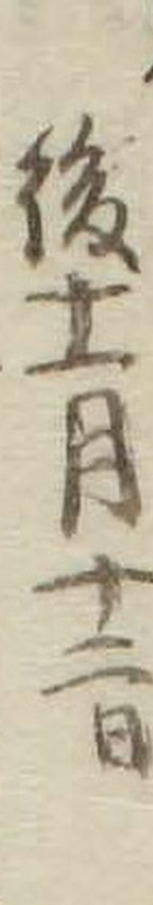後十一月十二日
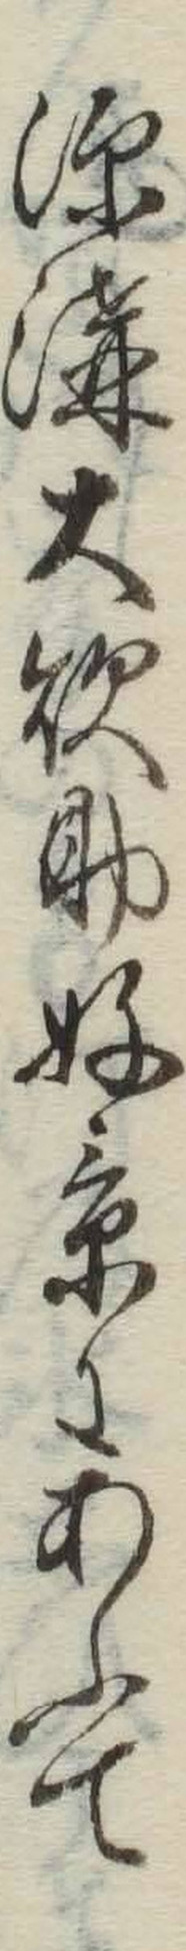深溝大炊助好景にあふて
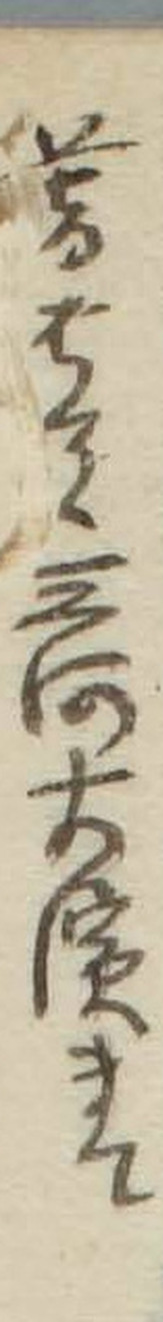暮はてゝ三河大浜まて
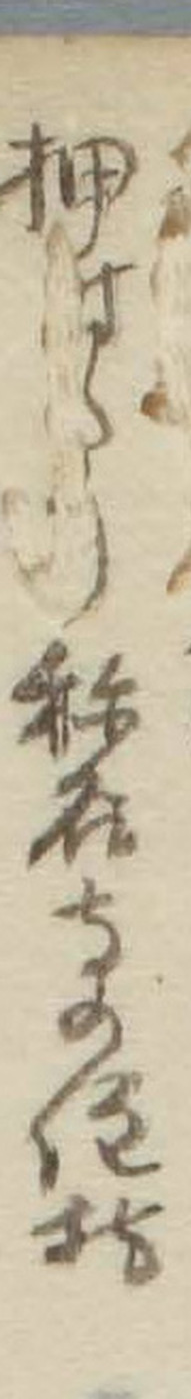押付たり称名寺の住持
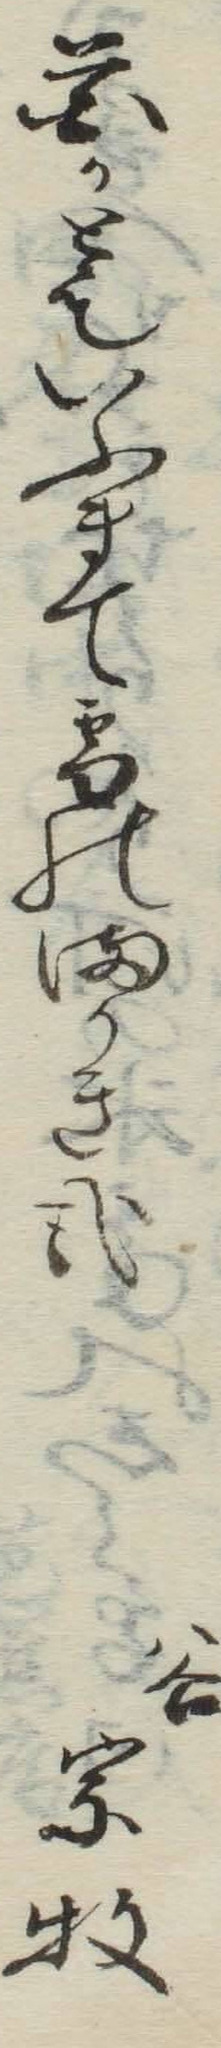花かともいふまて雪のまかき哉谷宗牧
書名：三河国二葉松
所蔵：国文学研究資料館
